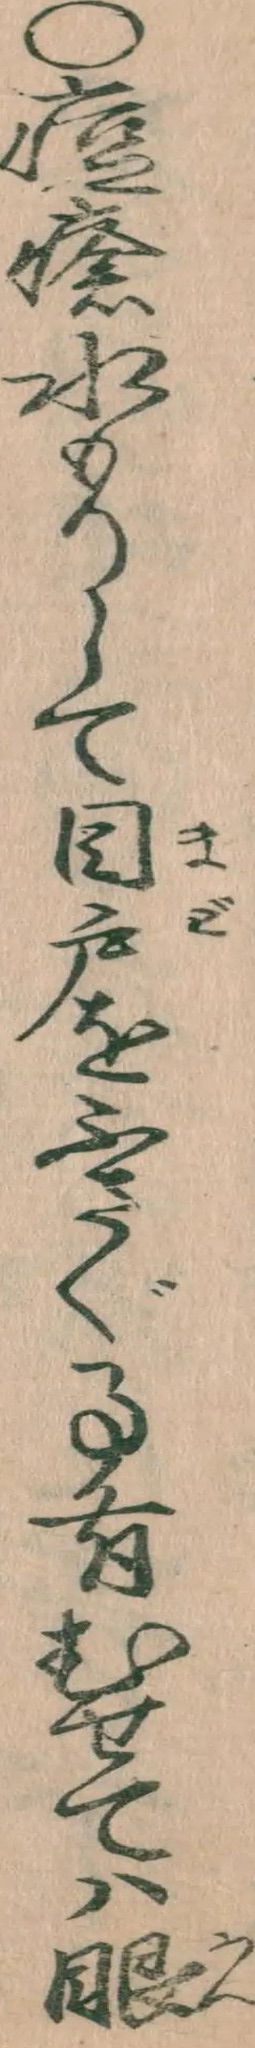○痘瘡水もりして目戸をふさぐ事有むせては眼
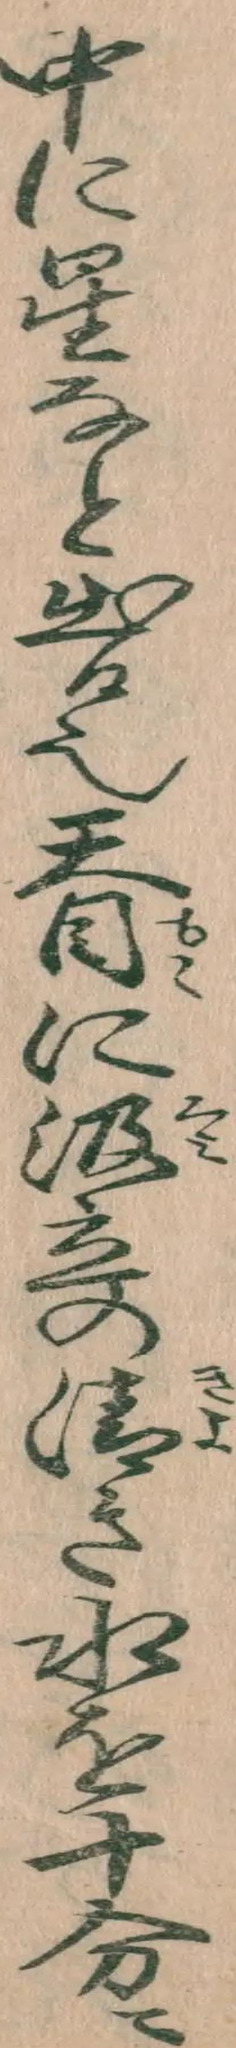中に星なと出る也天目に汲立の清き水を十分に
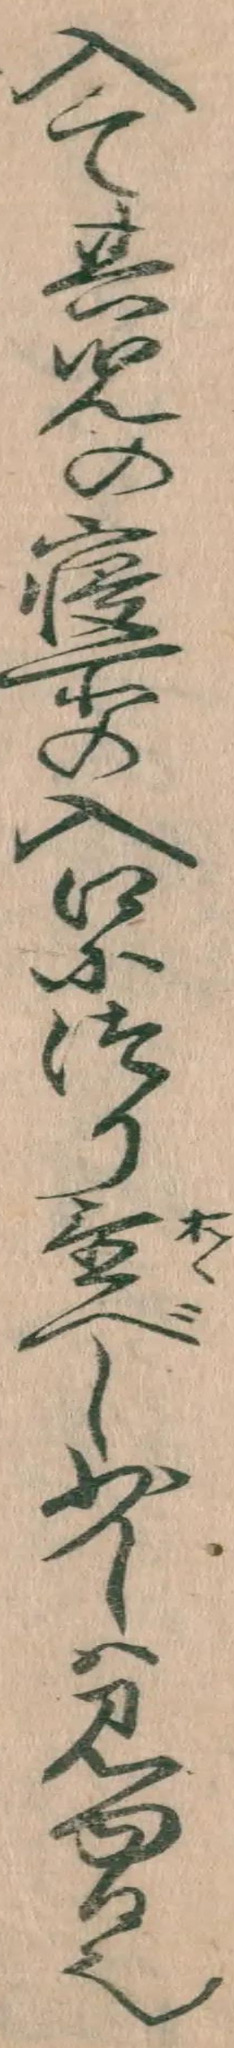入て其児の寝所の入口につり置べし少しは見ゆる也
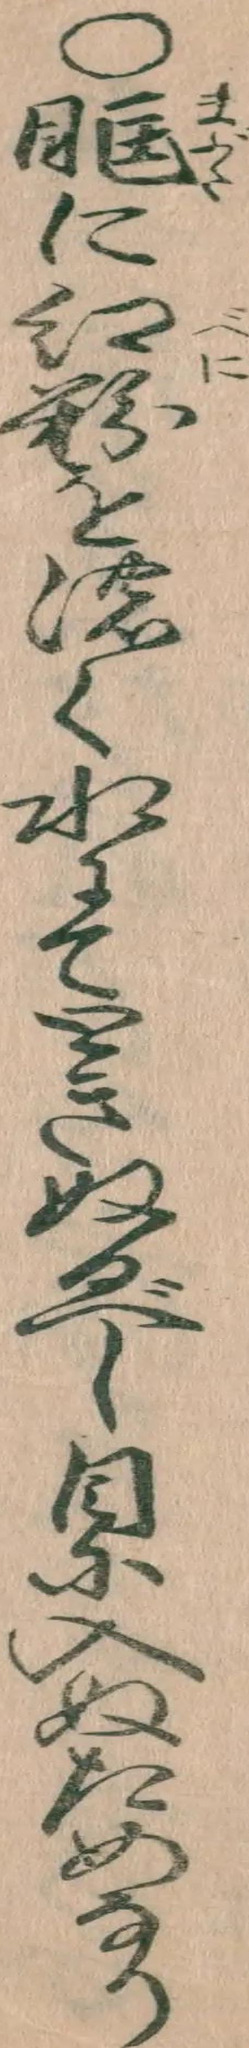○眶に紅粉を濃く水にてときぬるべし目に入ぬためなり
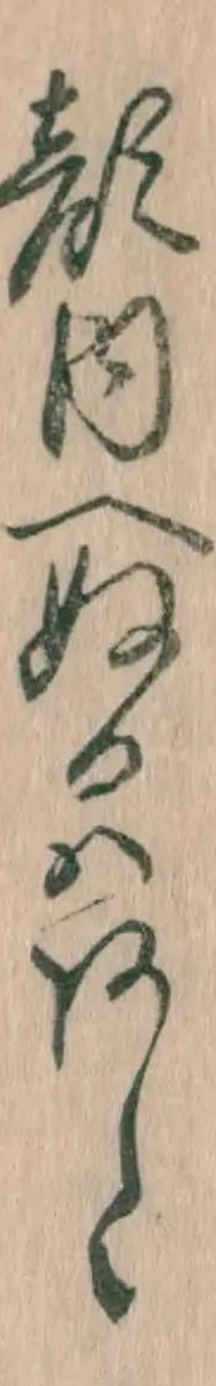顔内へぬるはあと
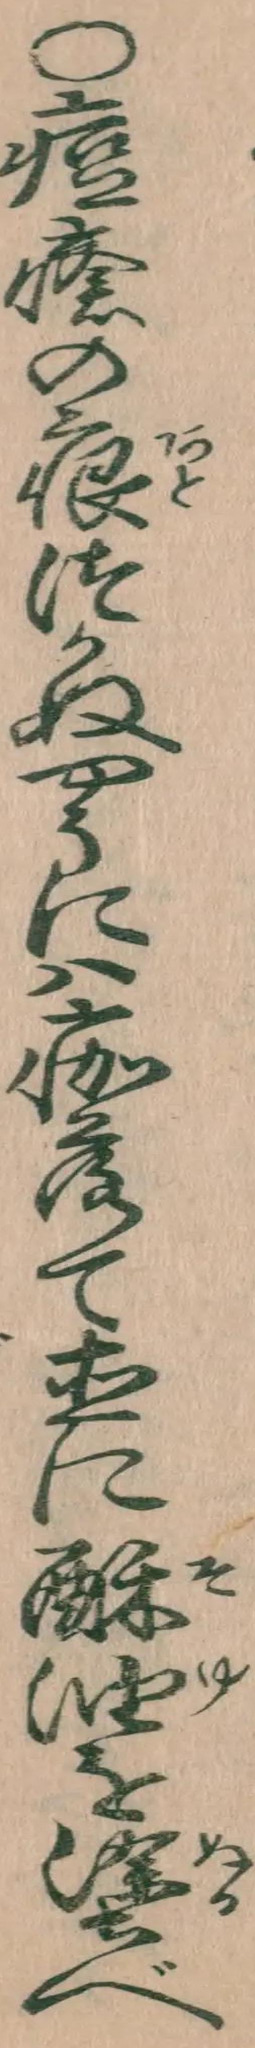○痘瘡の痕つかぬやうには痂落て直に酥油を塗べ
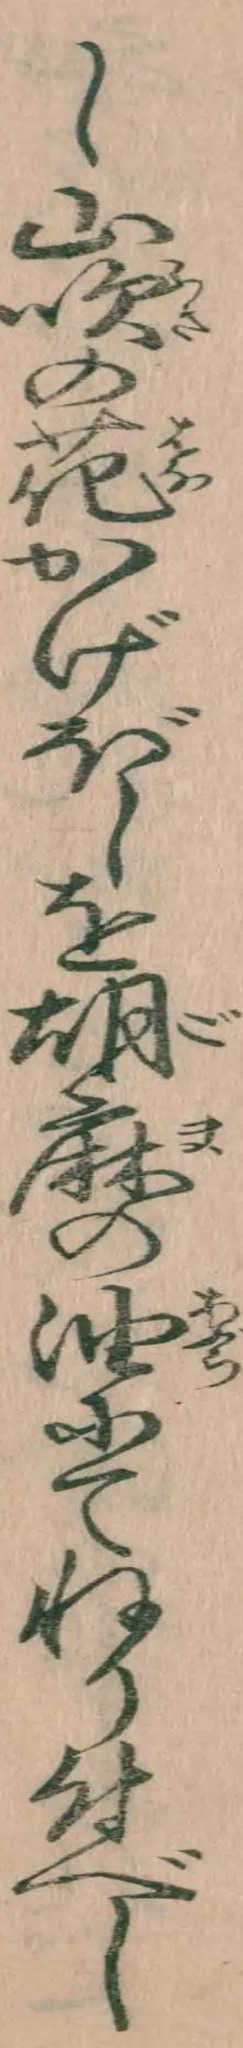し山吹の花かげぼしを胡麻の油にてねり付べし
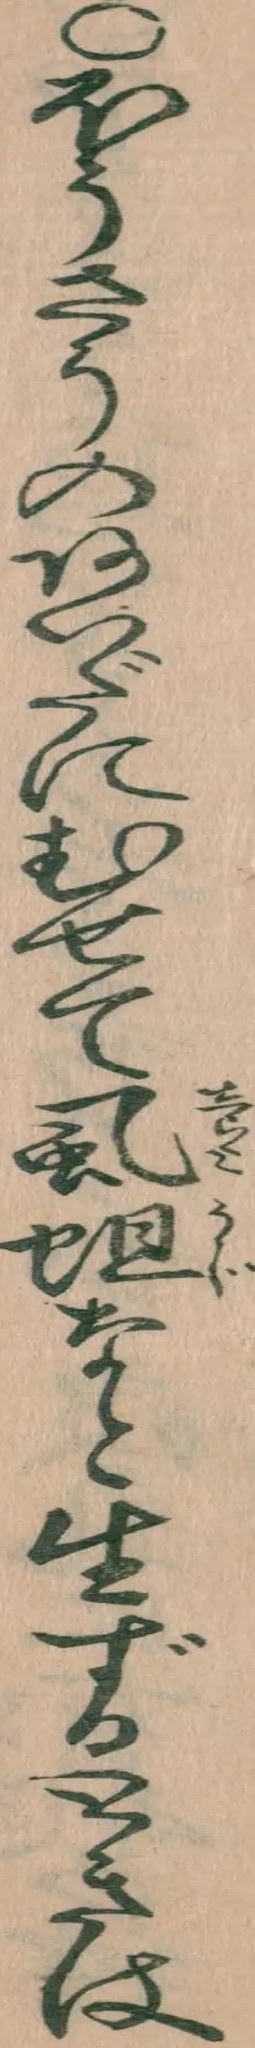○ほうさうのあいだにむせて虱蛆なと生ずるときは
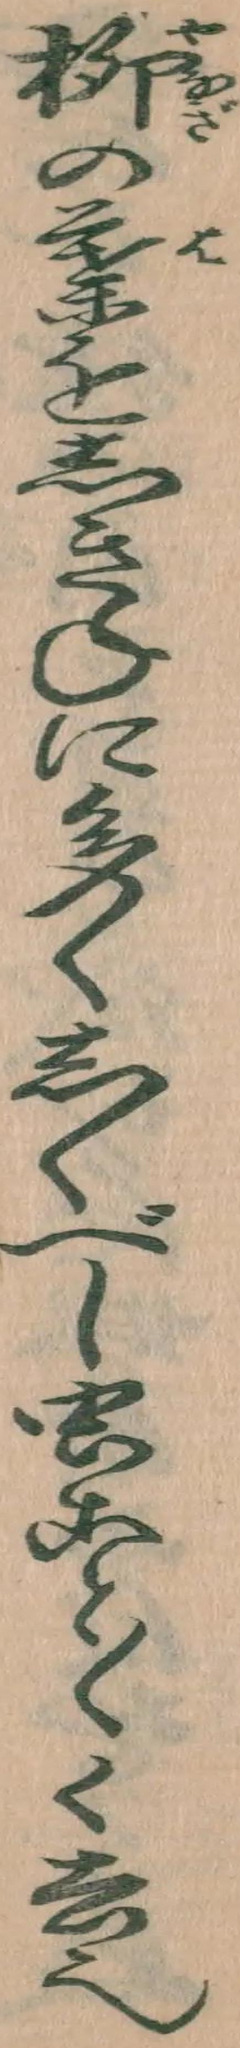柳の葉をしきねに多くしくべし虫こと〳〵く去也
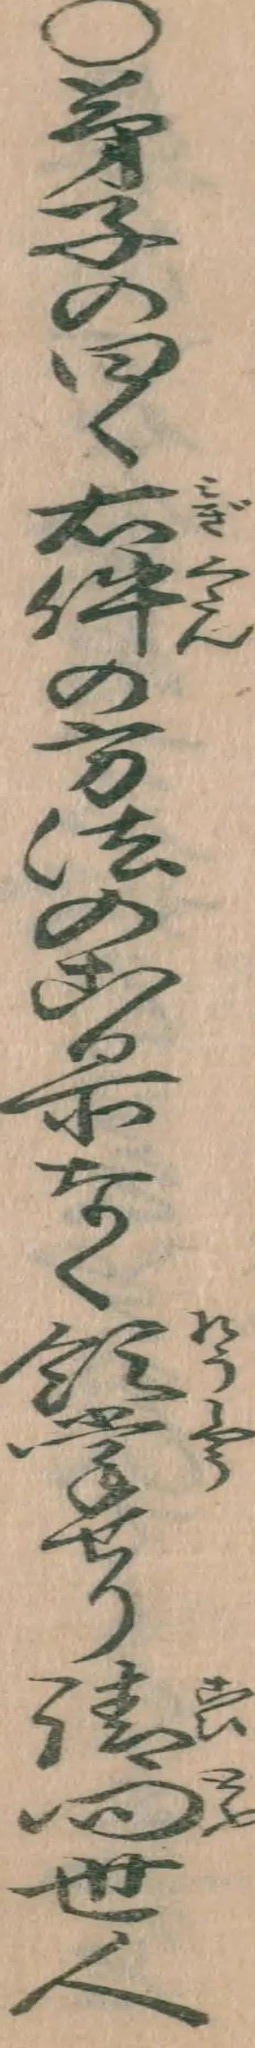○弟子の曰く右件の方法のこる所なく領掌せり請問世人
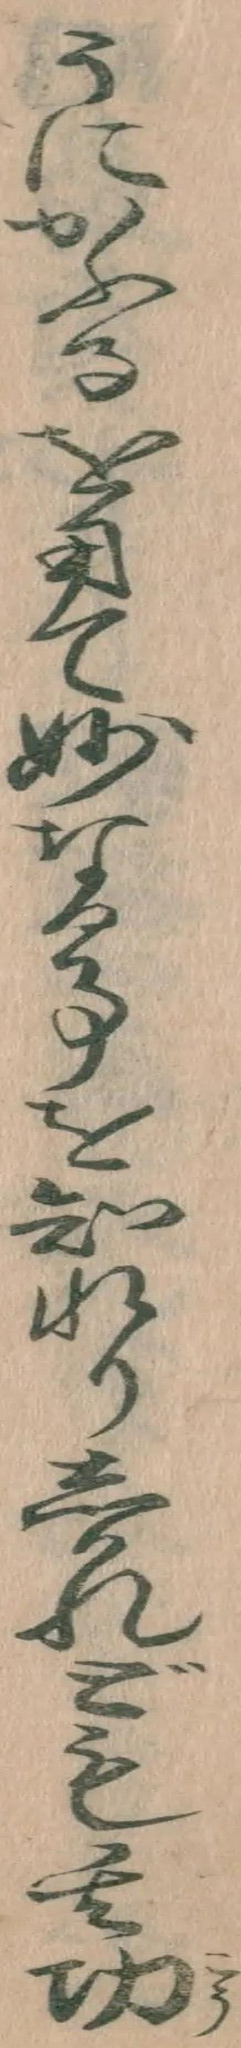うにかふるを用て妙なる事を知れりしかれども其功
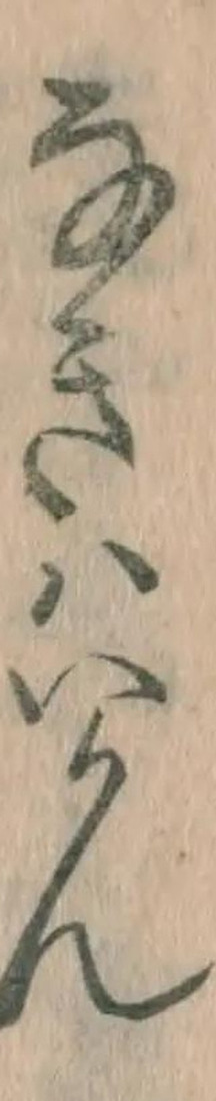なきはいかん
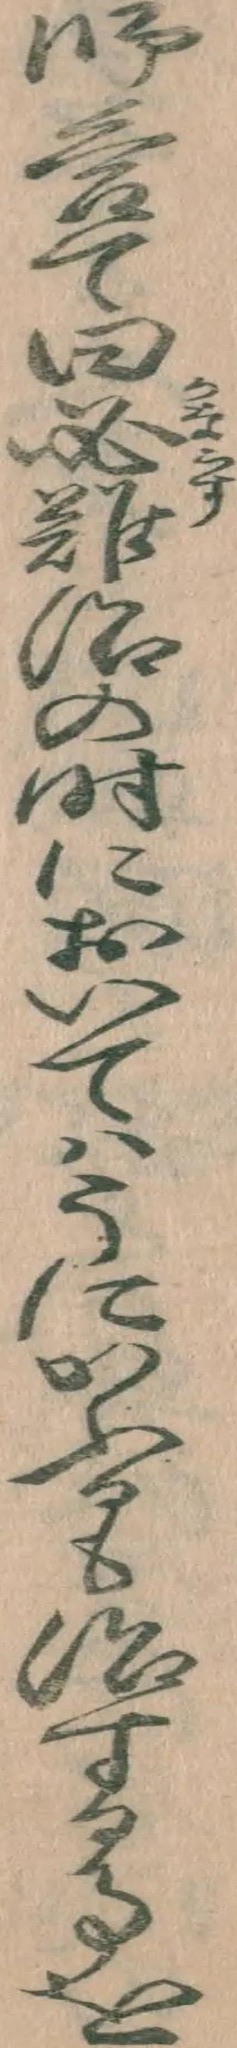師答て曰必難治の時においてはうにかふるも治する事を
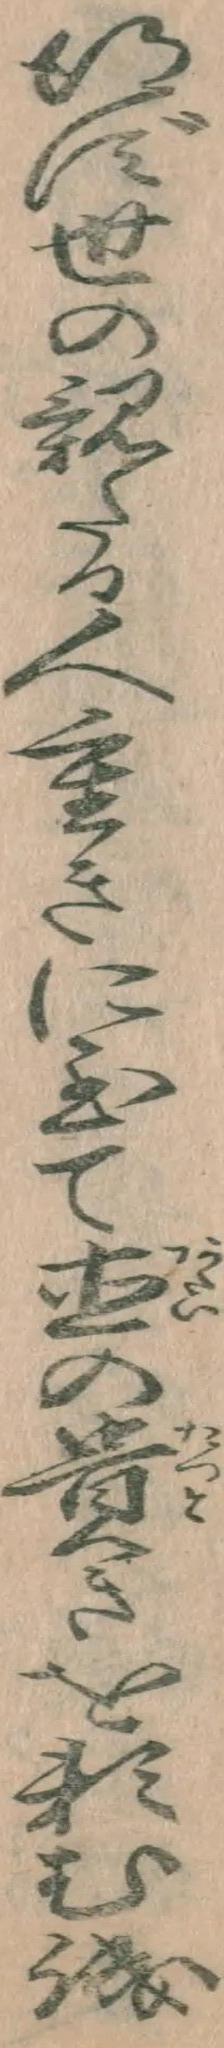得ず世の親たる人重きに至て直の貴きを頼む誠
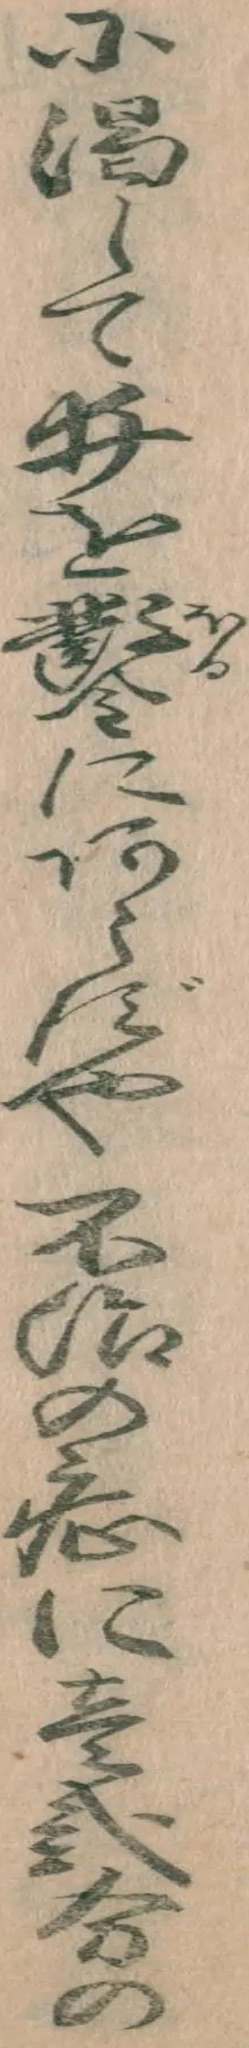に渇して井を鑿にあらずや不治の症に壱弐分の
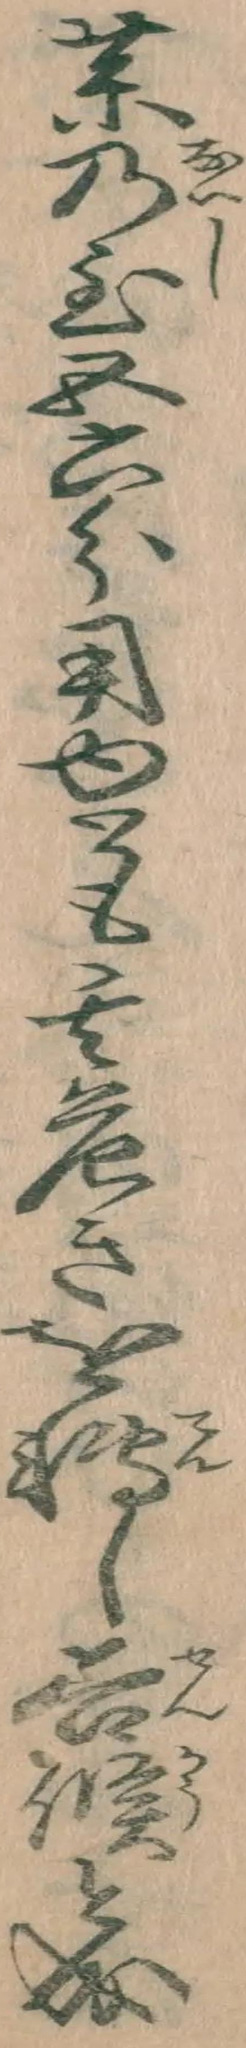薬乃至五六分用ゆとも其危きを転し善候と成
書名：痘家初心問答
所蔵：国立国会図書館 National Diet Library, JAPAN
